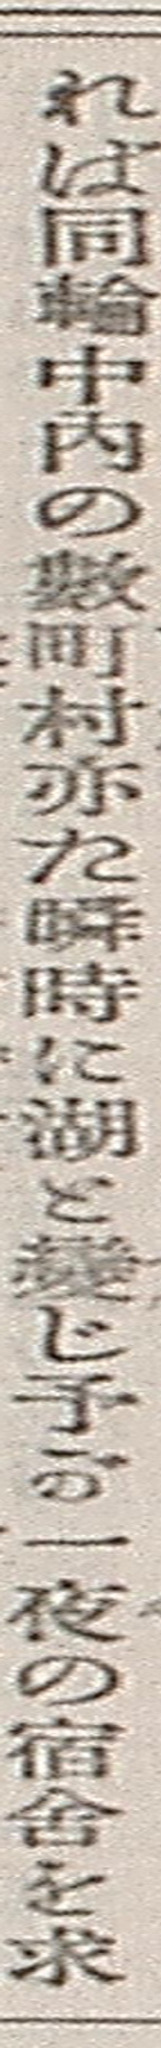れば同輪中内の数町村亦た瞬時に湖と変じ予が一夜の宿舎を求
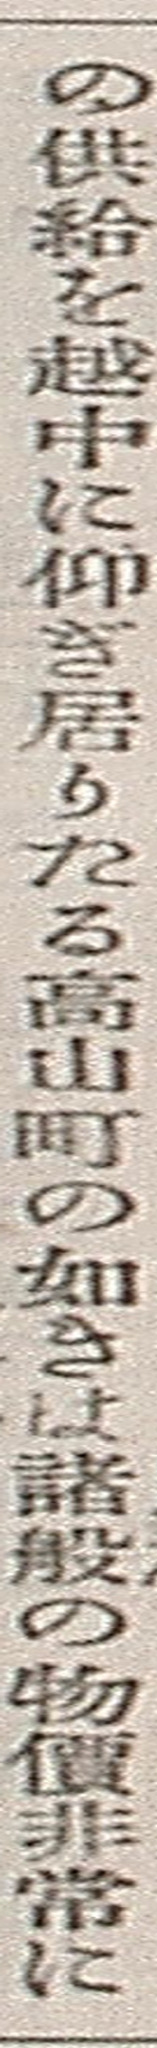の供給を越中に仰ぎ居りたる高山町の如きは諸般の物価非常に
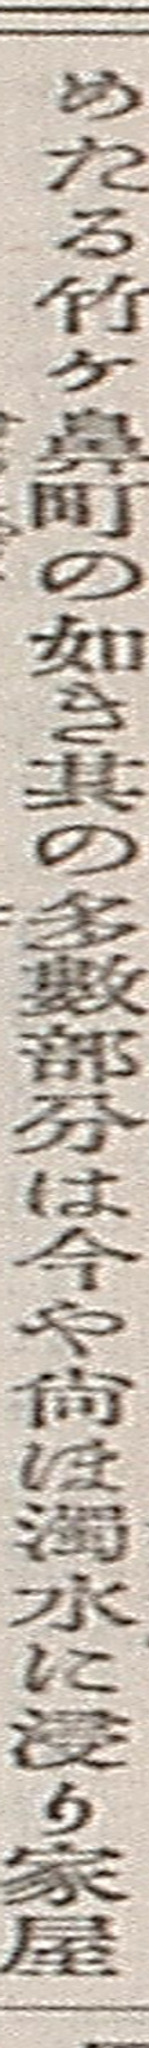めたる竹ヶ鼻町の如き其の多数部分は今や尚ほ濁水に浸り家屋
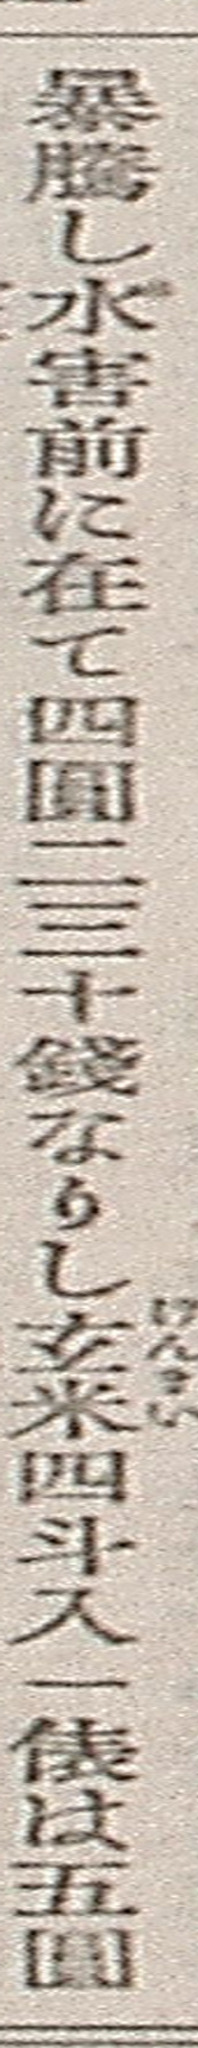暴騰し水害前に在て四円二三十銭なりし玄米四斗入一俵は五円
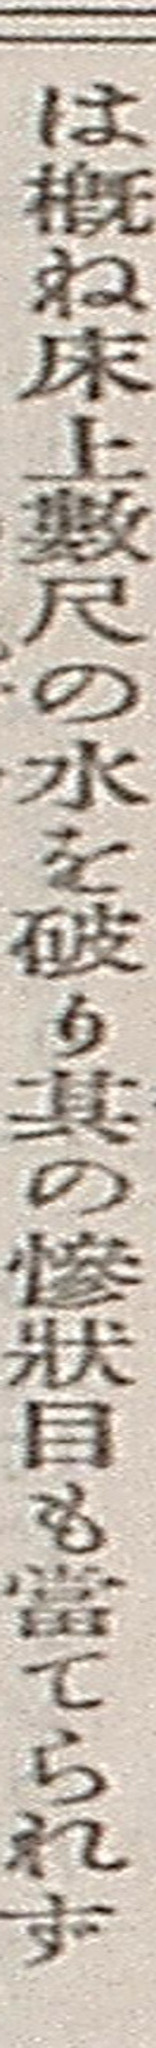は概ね床上数尺の水を破り其の惨状目も当てられず
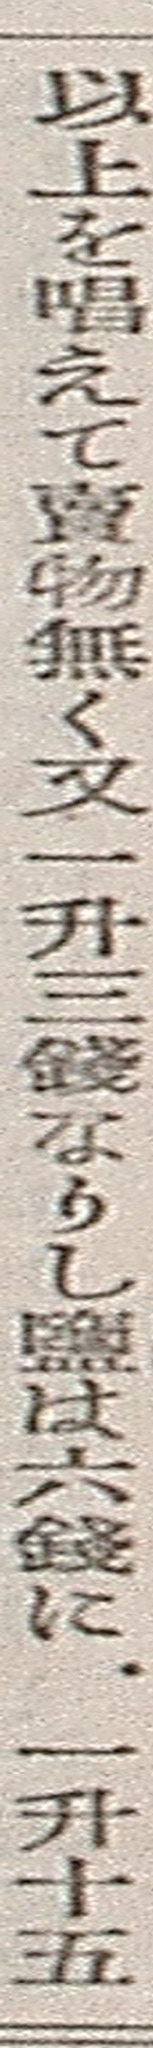以上を唱えて売物無く又一升三銭なりし鹽は六銭に、一升十五
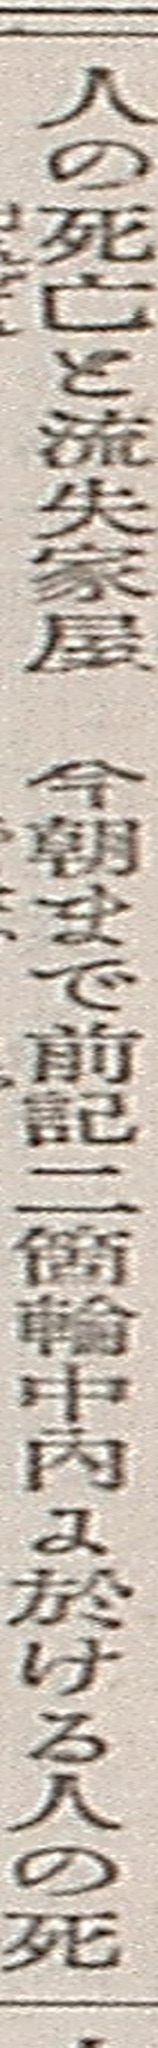人の死亡と流失家屋今朝まで前記二箇輪中内に於ける人の死
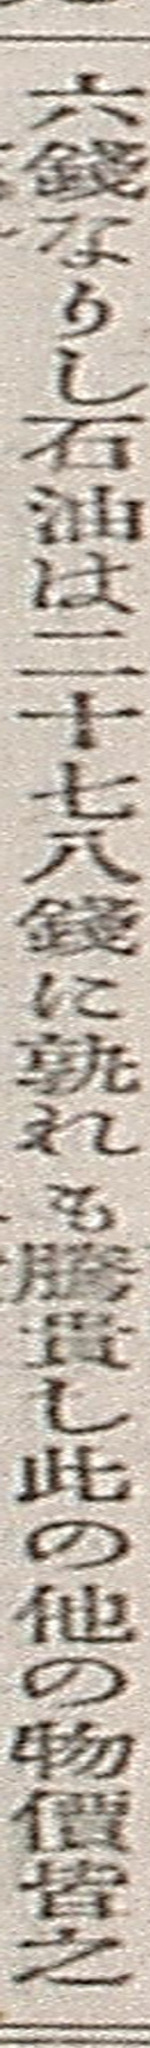六銭なりし石油は二十七八銭に孰れも騰貴し此の他の物価皆之
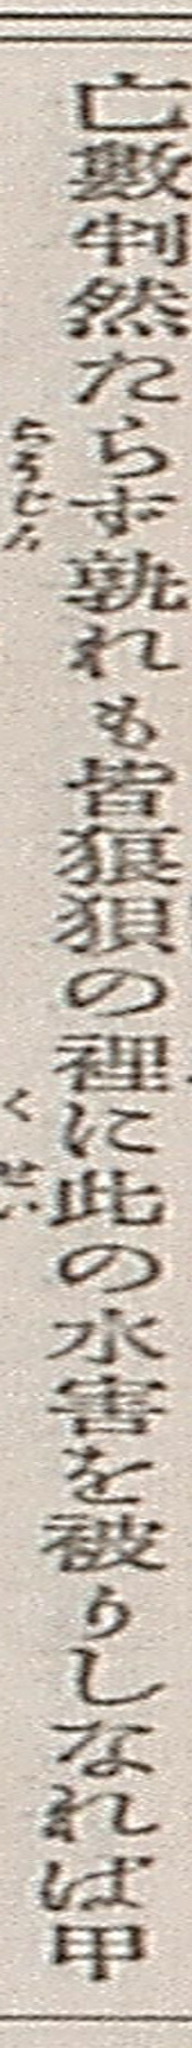亡数判然たらず孰れも皆狼狽の裡に此の水害を被りしなれば甲
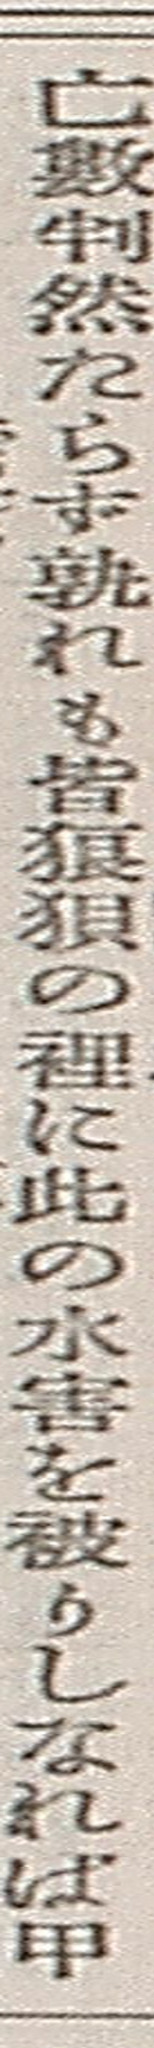亡数判然たらず孰れも皆狼狽の裡に此の水害を被りしなれば甲
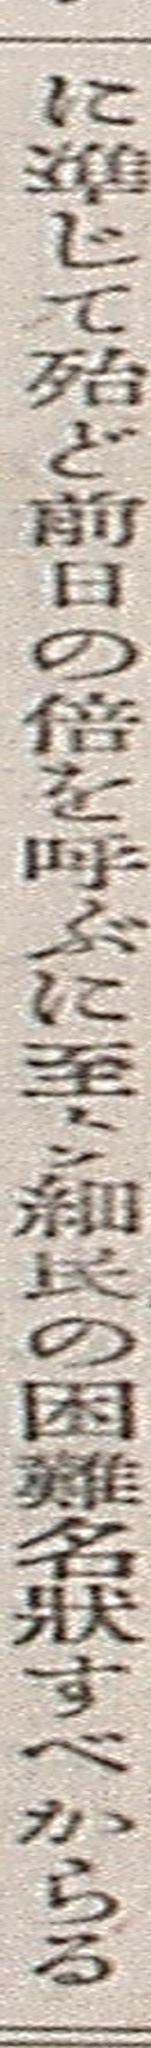に準じて殆ど前日の倍を呼ぶに至り細民の困難名状すべからる
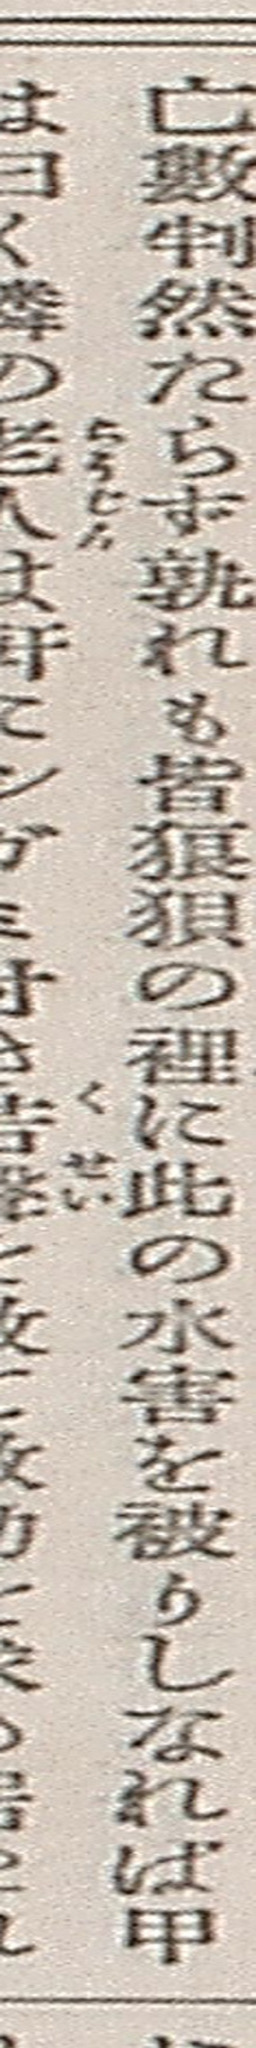は曰く隣の老人は軒にシガミ付き苦声を放て救助を求め居たれ
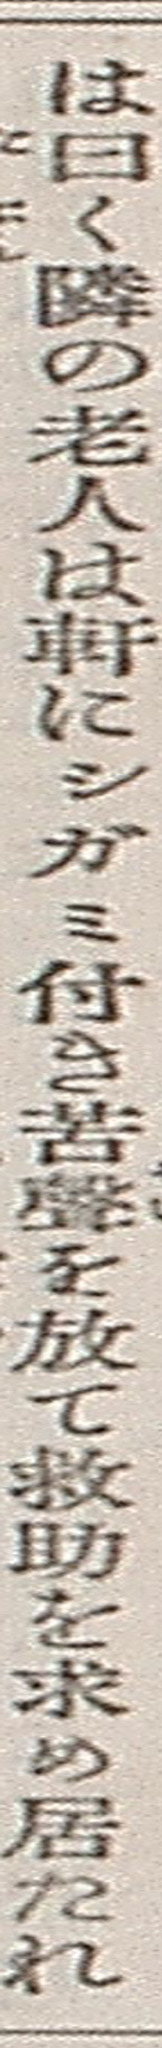は曰く隣の老人は軒にシガミ付き苦声を放て救助を求め居たれ
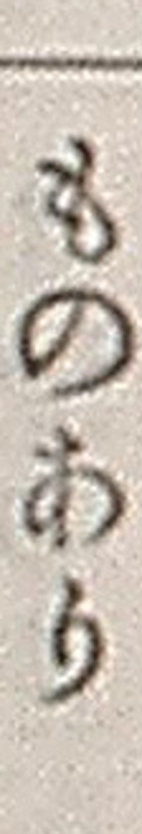ものあり
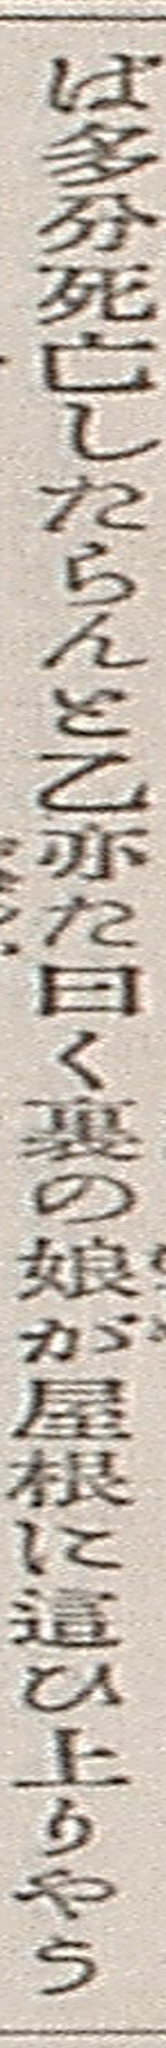ば多分死亡したらんと乙亦た曰裏の娘が屋根に這ひ上りやう
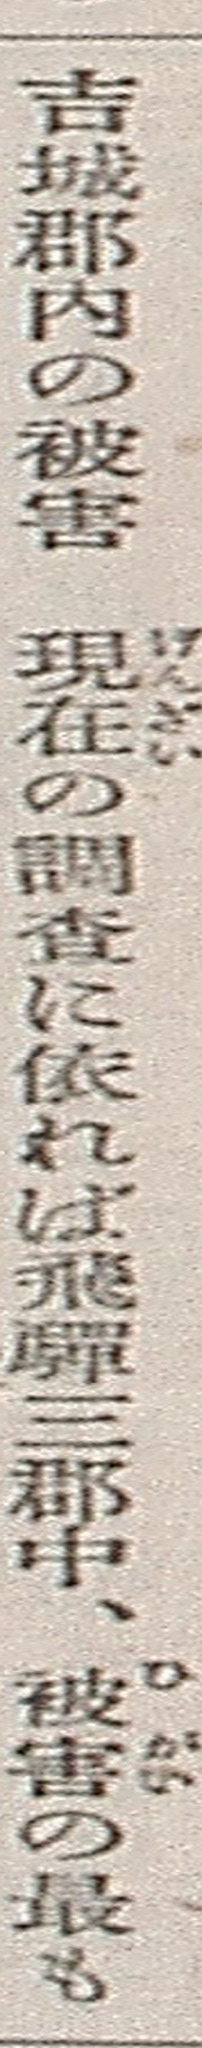吉城郡内の被害現在の調査に依れば飛騨三郡中、被害の最も
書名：風俗畫報臨時増刊第百二十六號　洪水被害録（中）
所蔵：東京大学地震研究所図書室 Earthquake Research Institute Library, The University of Tokyo, JAPAN
